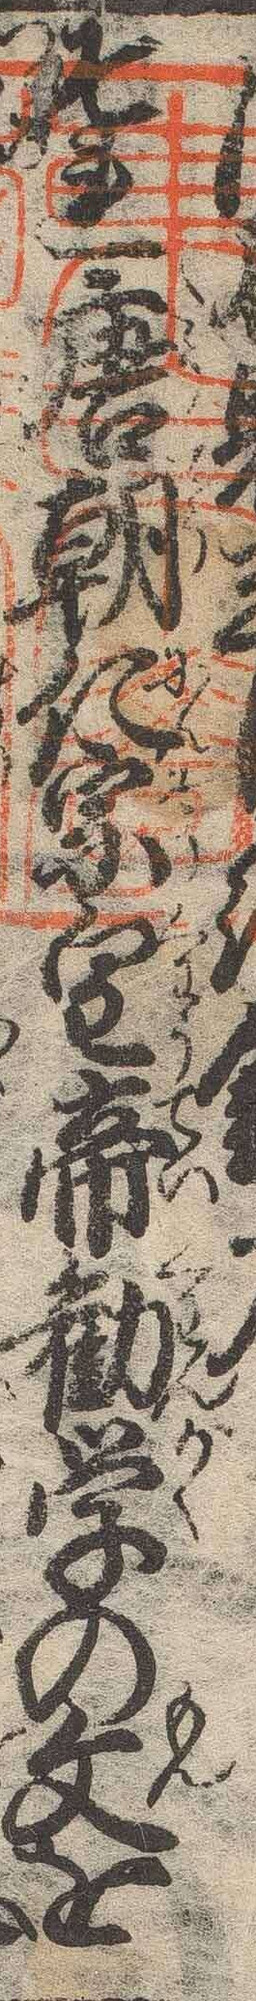それ唐朝仁宗皇帝勧学の文を
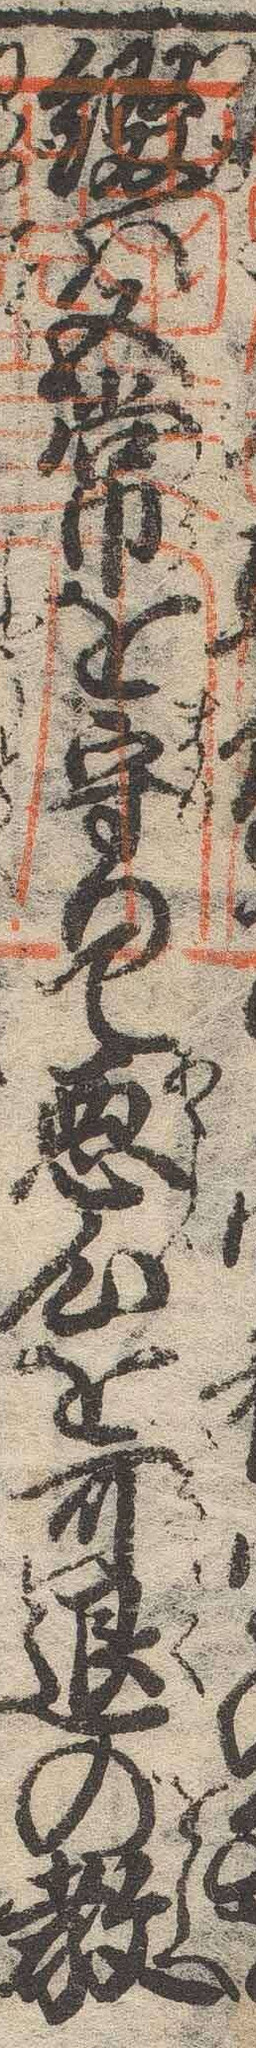綴は五常を守りて悪心を可退の教
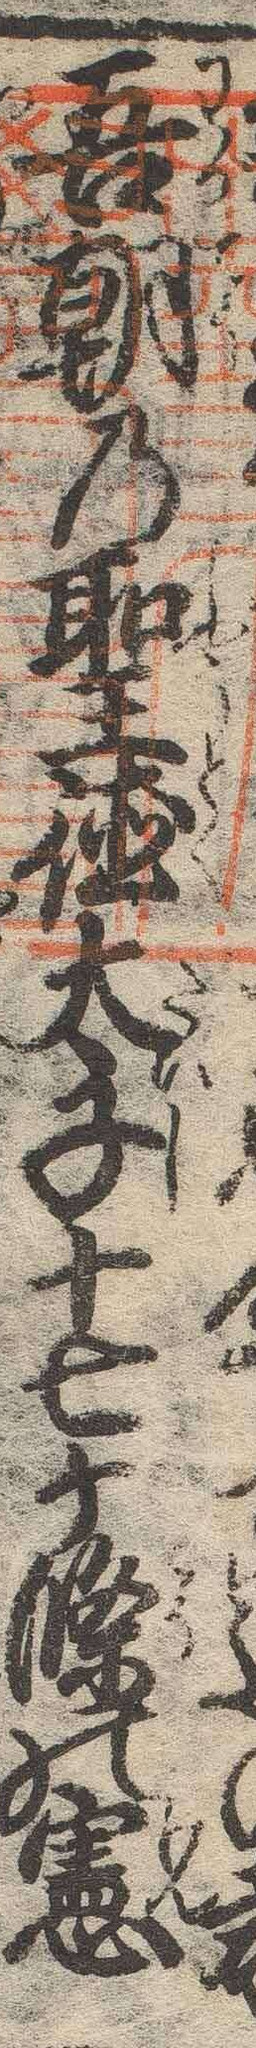吾朝の聖徳太子十七ケ條の憲
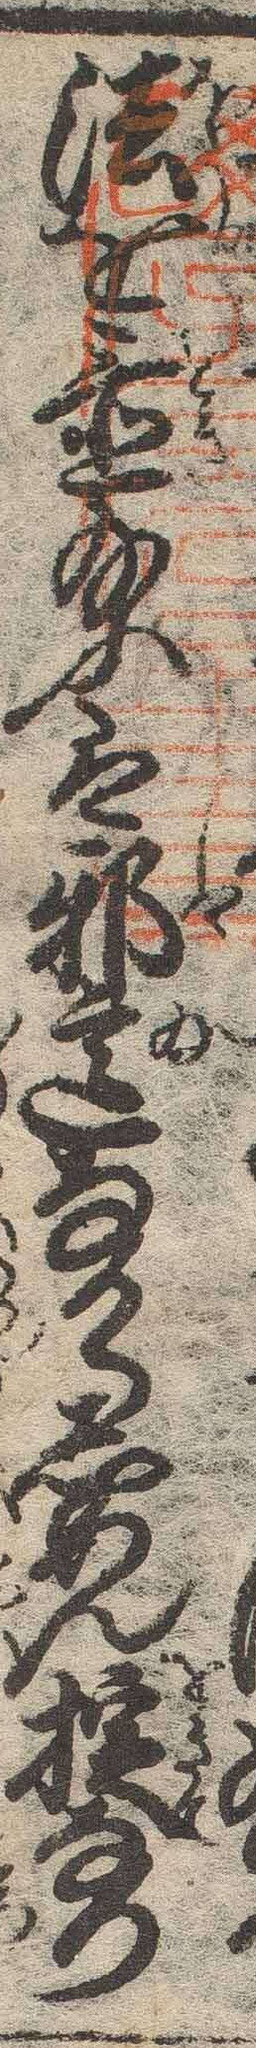法を置給ふは邪意なからしめん掟なり
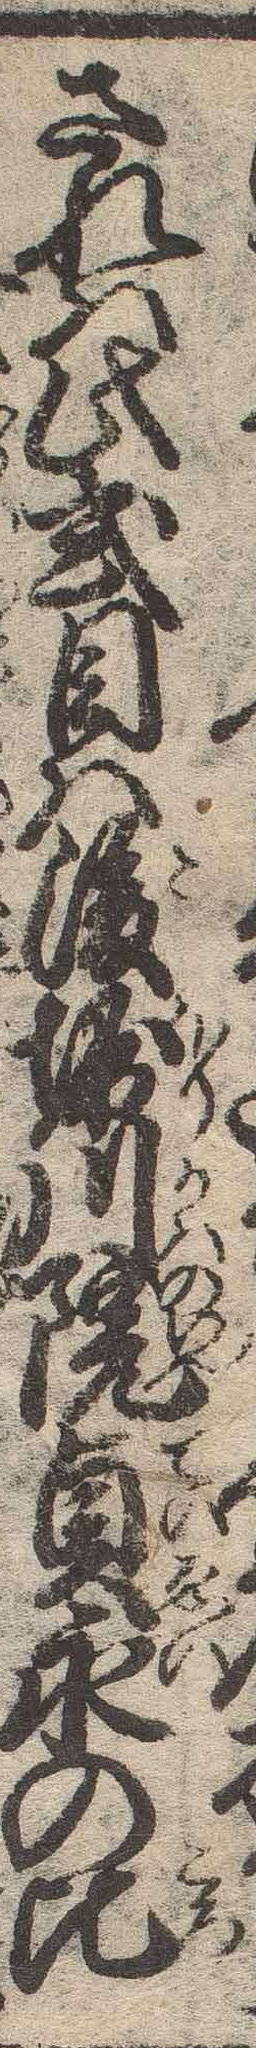されは此式目は後堀川院貞永の比
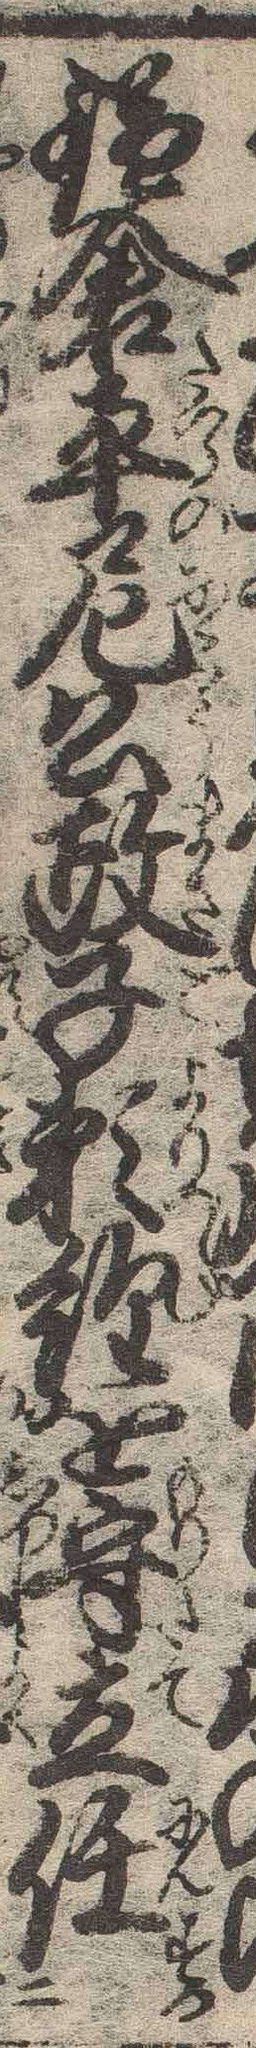鎌倉平尼公政子頼経を守立任
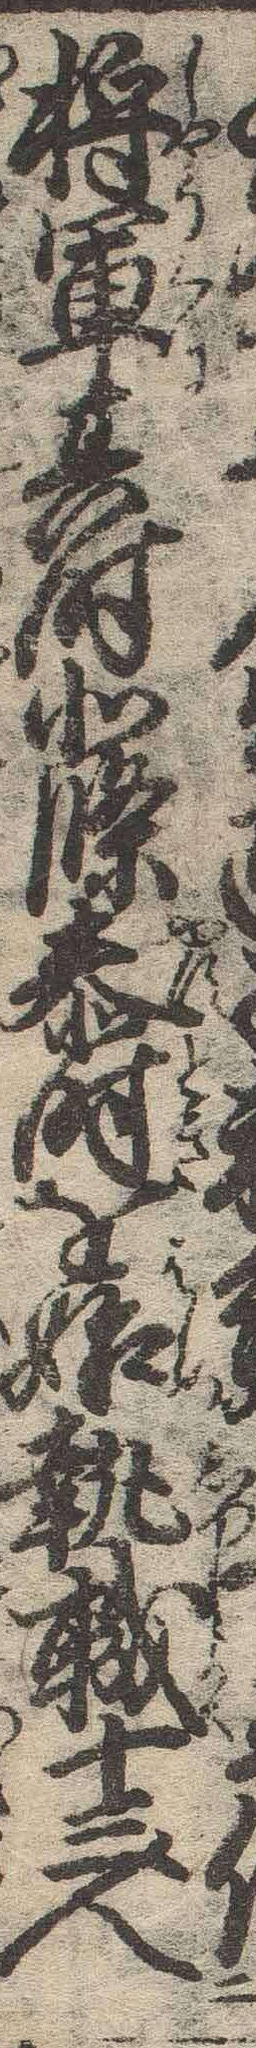将軍其時北條泰時を始執職十三人
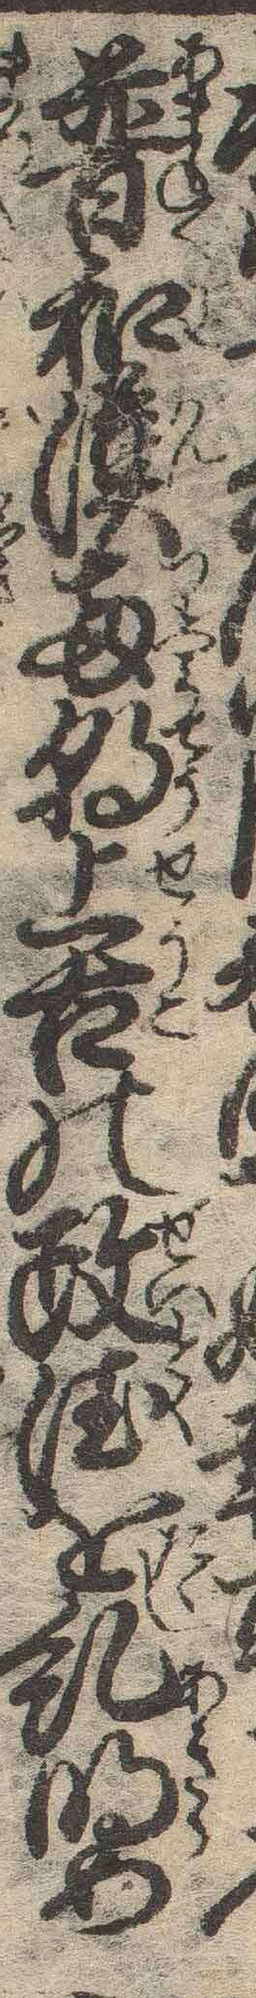普和漢両朝上古の政徳を糺明め
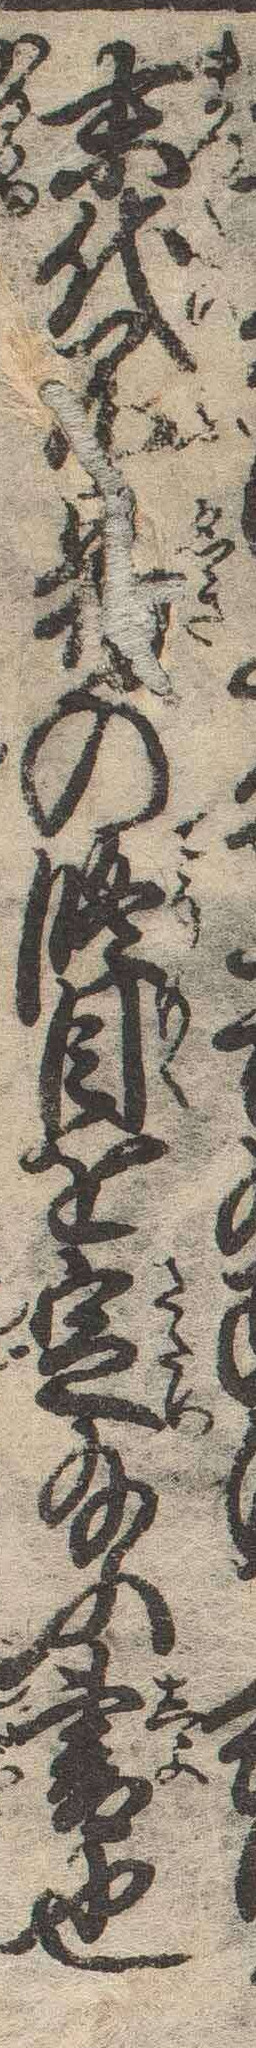末代不易の條目を定給ふ書也
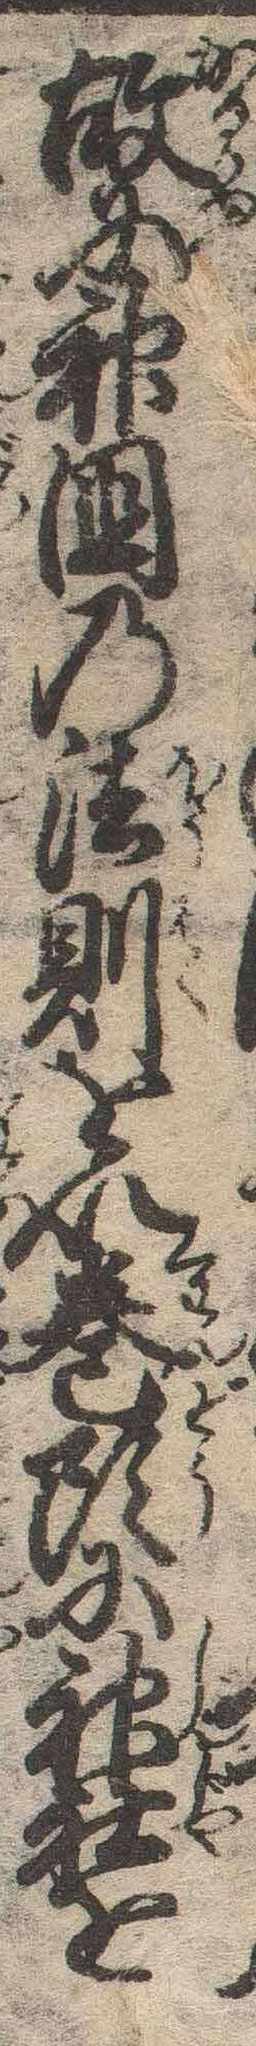故に神国の法則を以巻頭に神社を
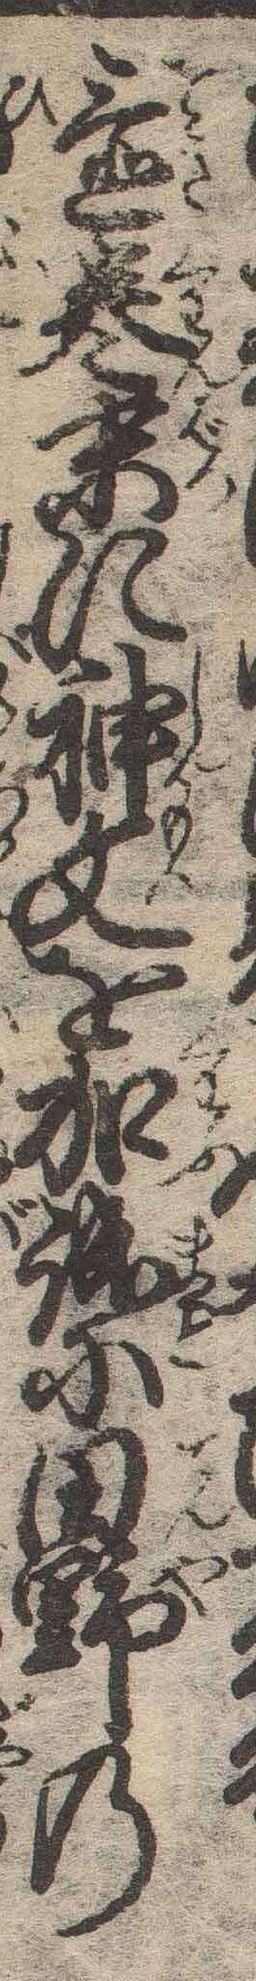置巻末に神文を加誠に田野の
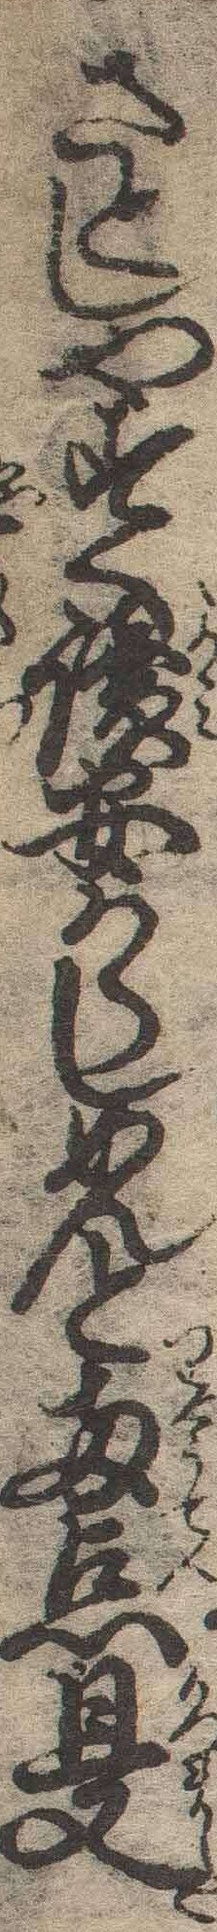さとしやすく読安からしめんと両点且又
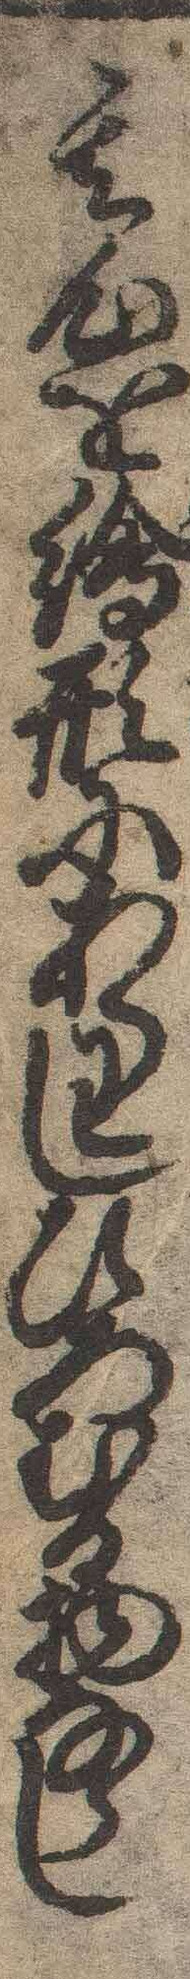其心を繪形にあらわしひろむる物ならし

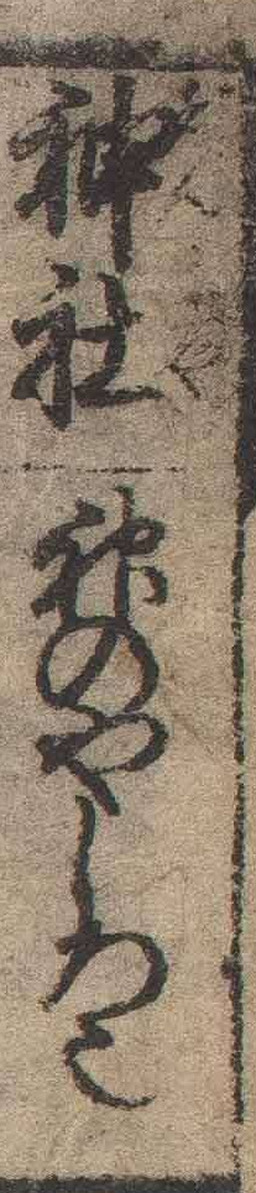神社神のやしろ也
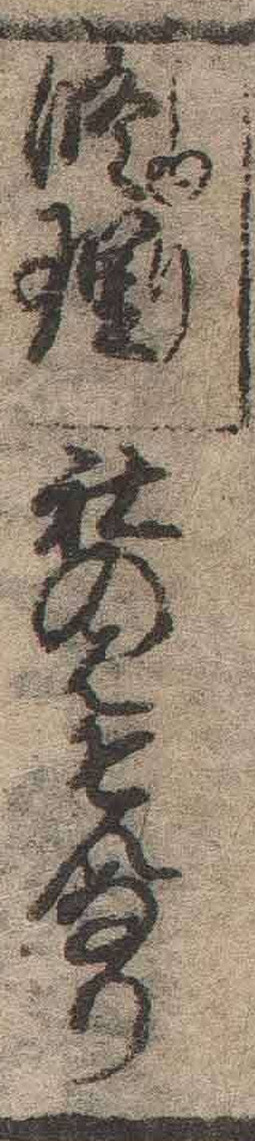修理社のはそんなり
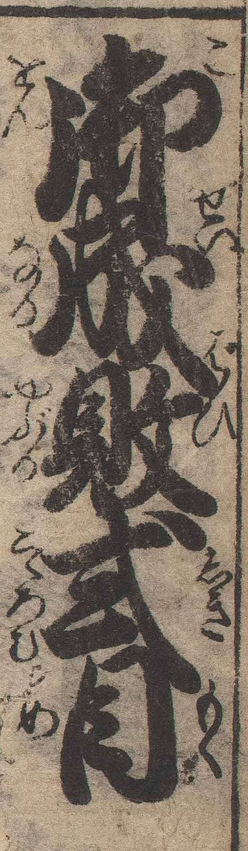御成敗式目
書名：御成敗式目絵抄
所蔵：東京学芸大学附属図書館 国文学研究資料館
